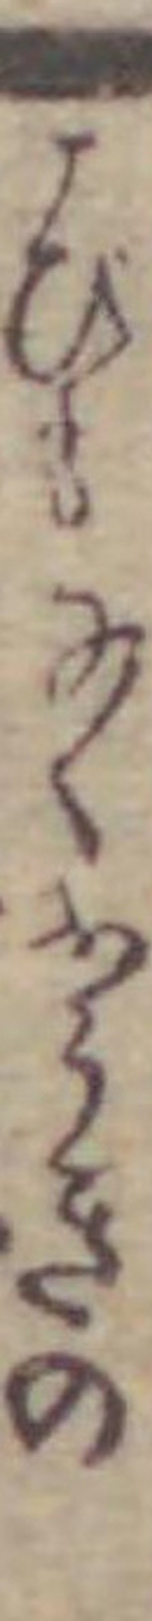こびもなくふうきの
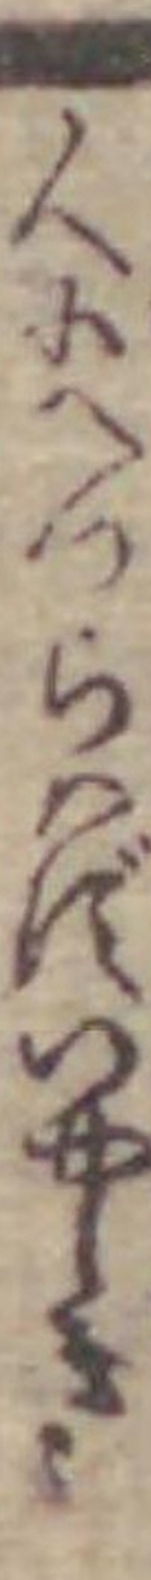人にへつらはずいやしき
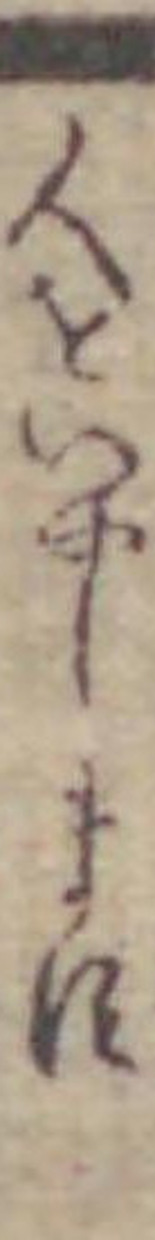人をいやします
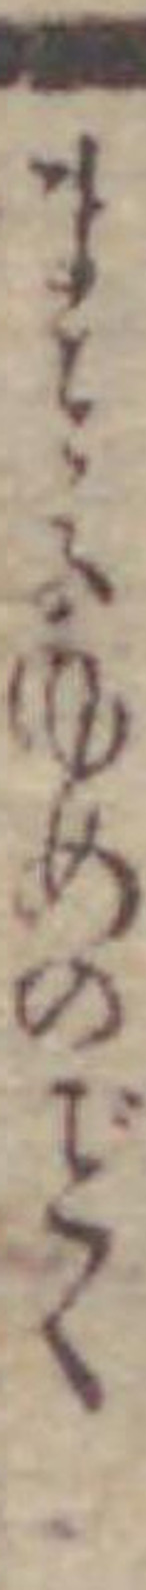まことにゆめのごとく
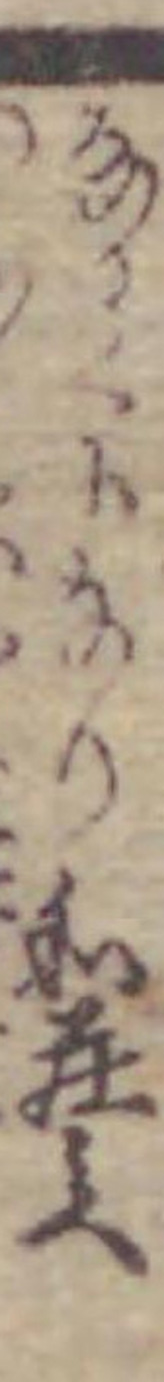なるくになり和荘兵へ
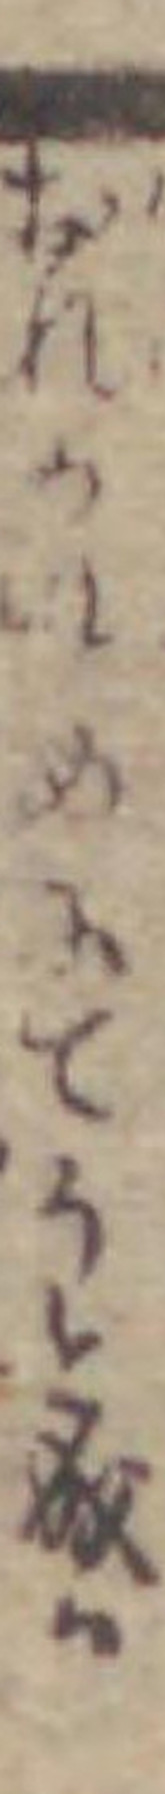おれかゆめにてうと成は
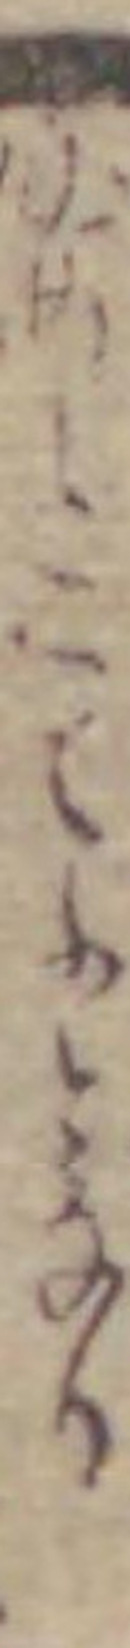ゆめにこてふとなり
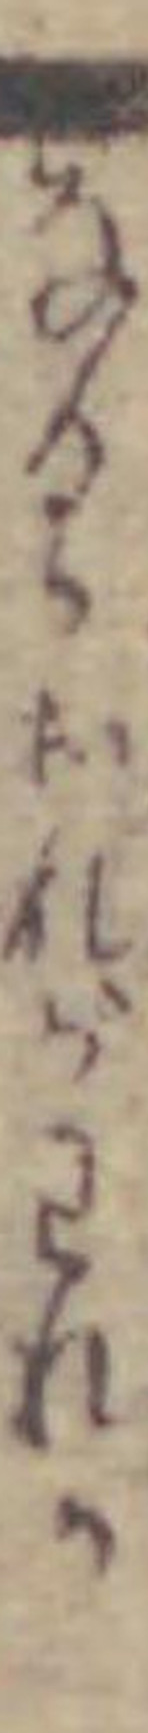なるかおれがわれか
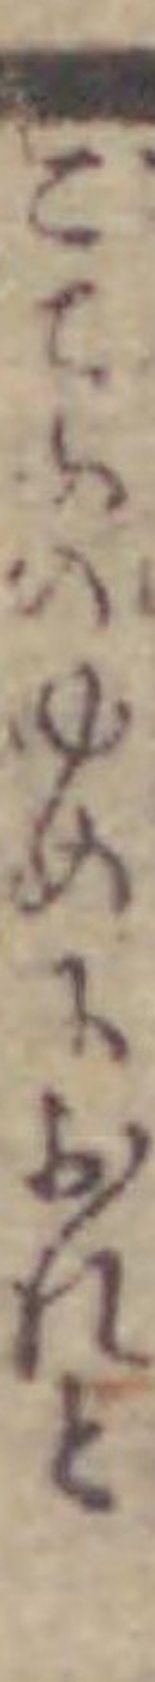こてふのゆめにおれと
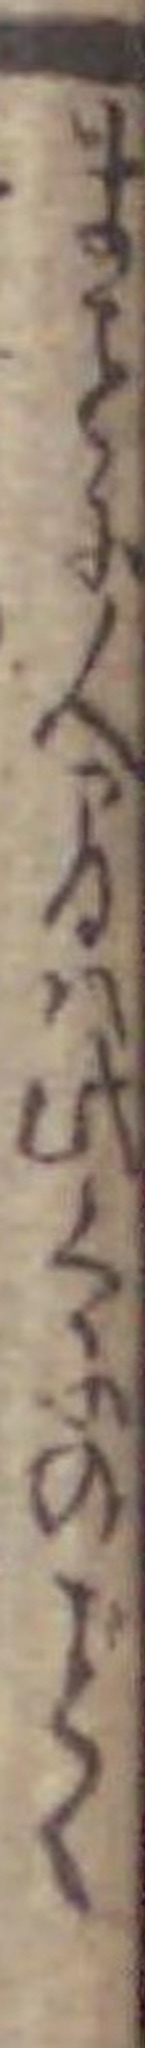まことに人間は此くにのごとく
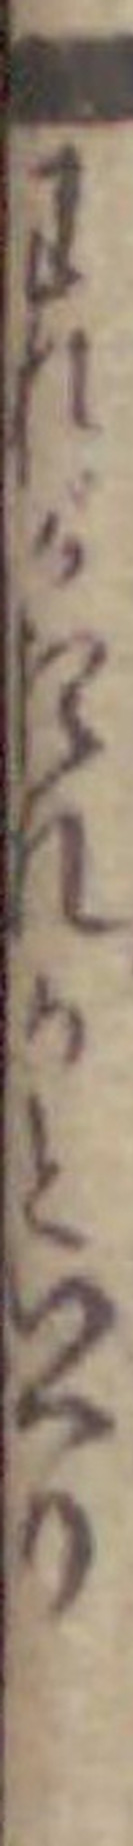われがおれかといへり
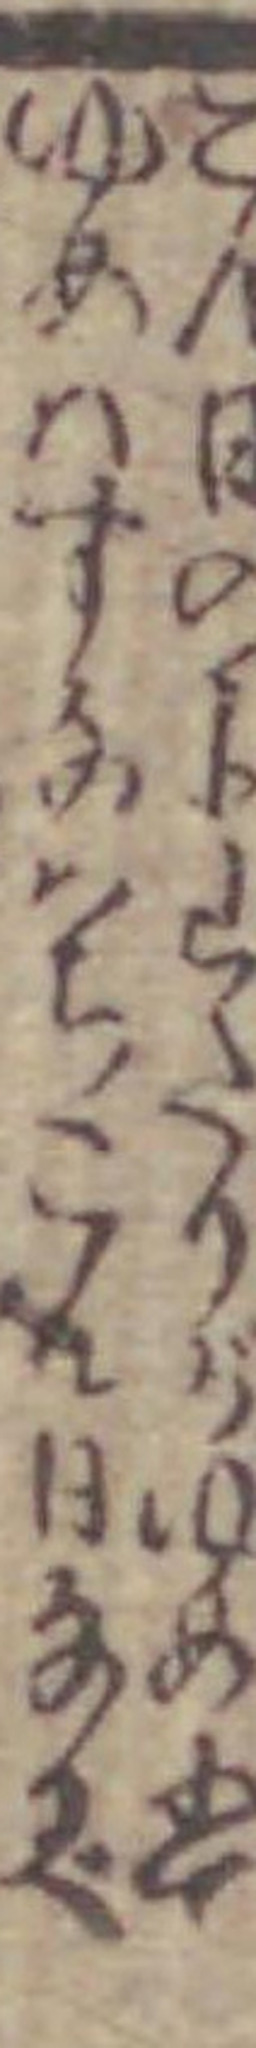ゆめはすなはちこん日なるべ
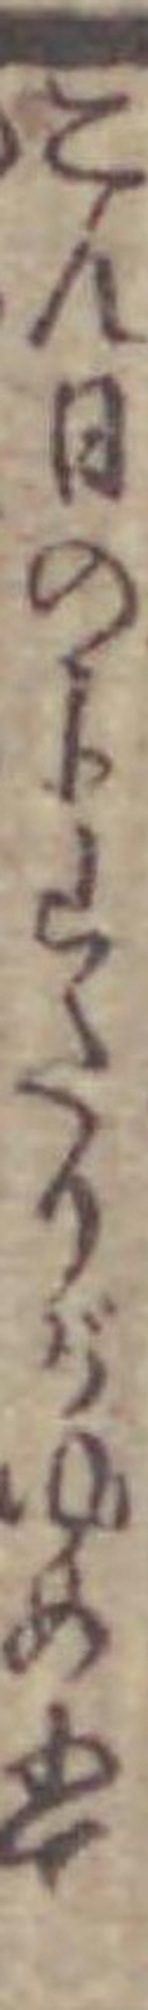こん日のよわたりがゆめにて
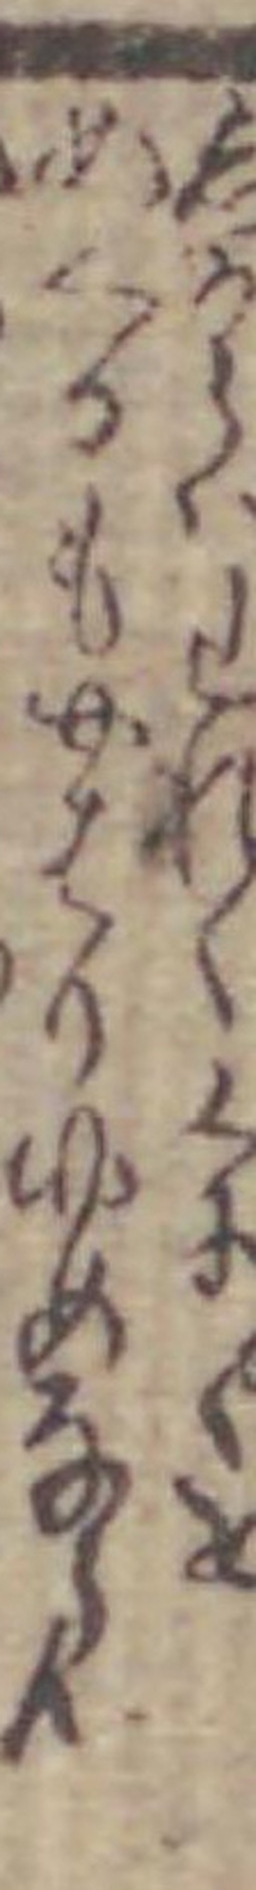めくるもやはりゆめならん
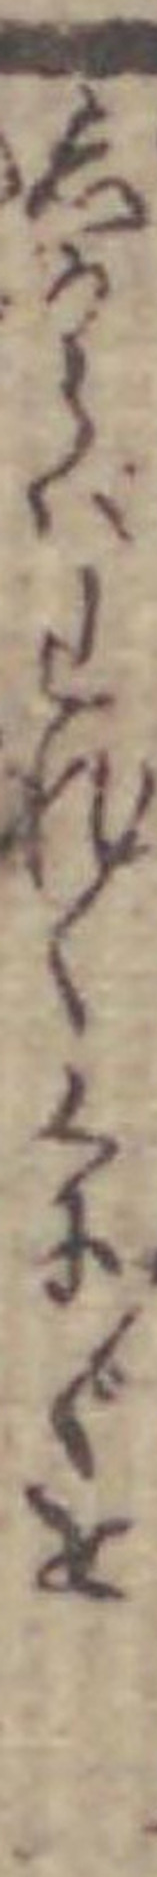しからばわれ〳〵くに〴〵を
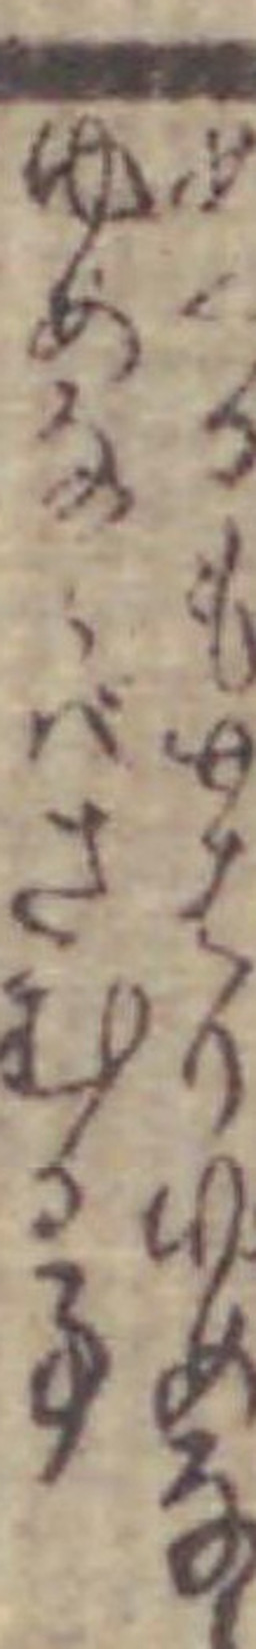ゆめならばさむる事
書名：和荘兵衛後日話 : 3巻
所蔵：国立国会図書館 National Diet Library, JAPAN
